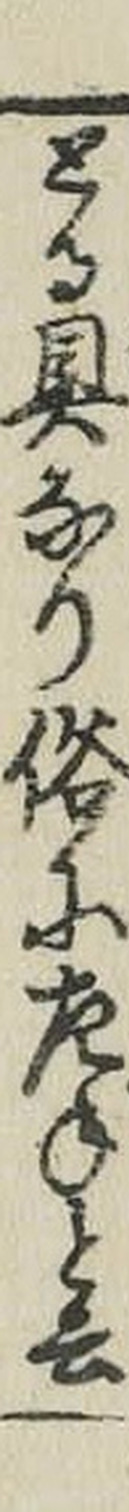とる具なり俗に左手と云
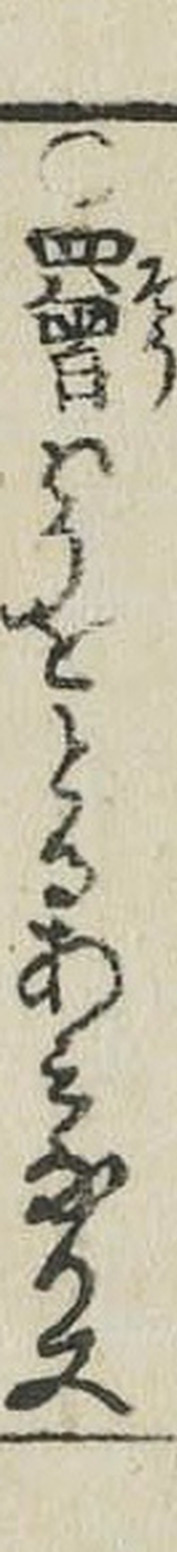○罾はうをとるあみなり又
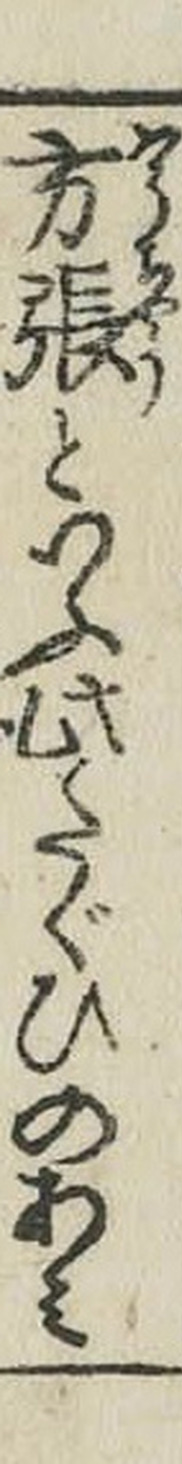方張といふ此たぐひのあみ
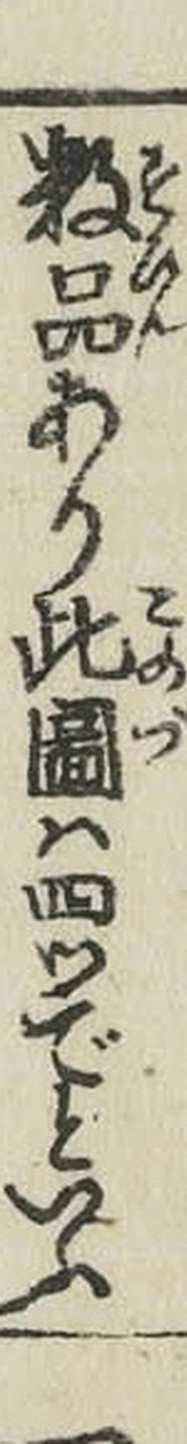数品あり此図は四つでといふ
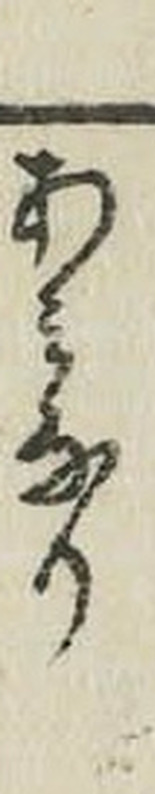あみなり
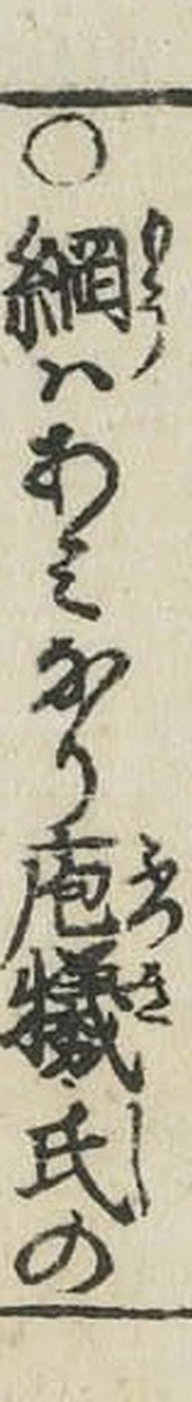○網はあみなり庖犠氏の
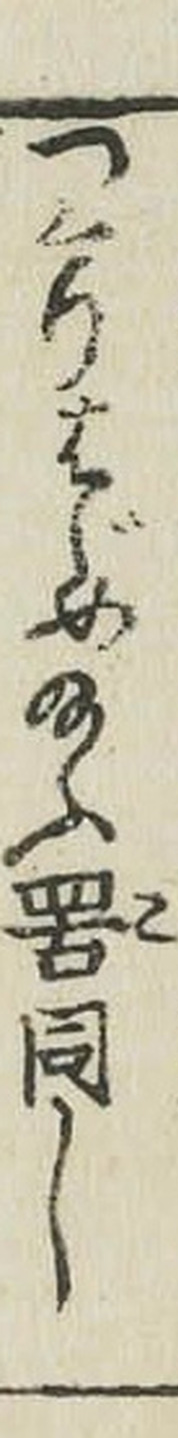つくりはじめ給ふ罟同し
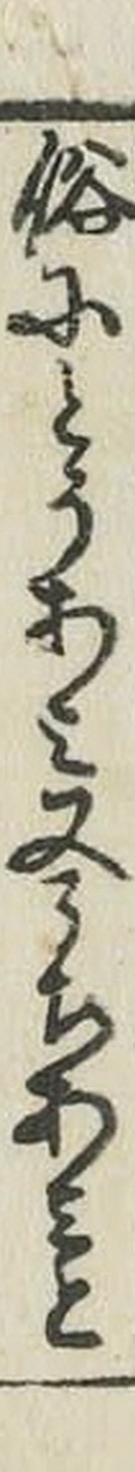俗にとうあみ又かちあみと
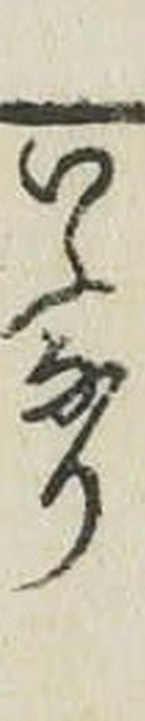いふなり
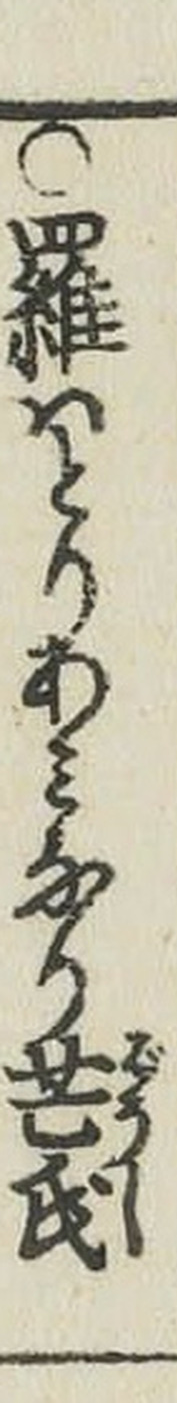○羅はとりあみなり芒氏
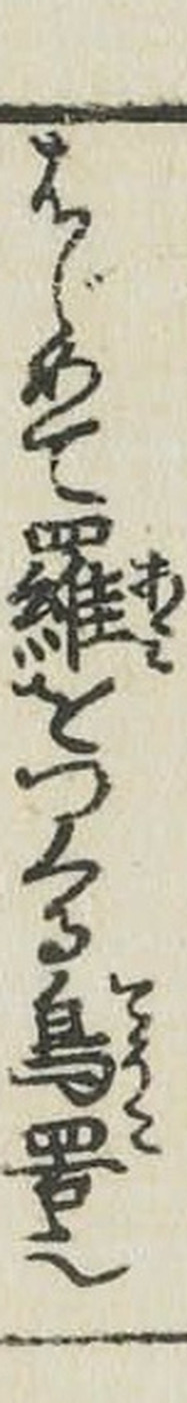はじめて羅をつくる鳥罟也
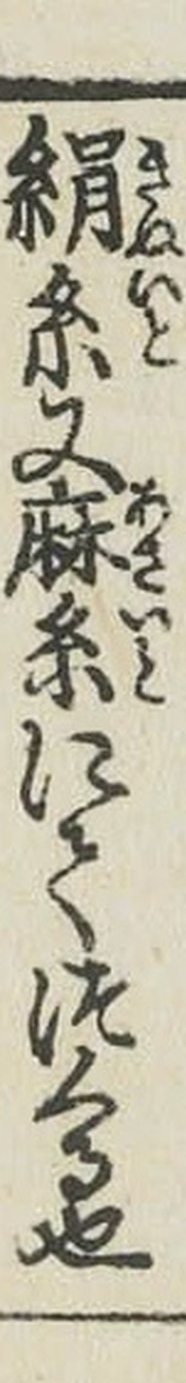絹糸又麻糸にてつくる也
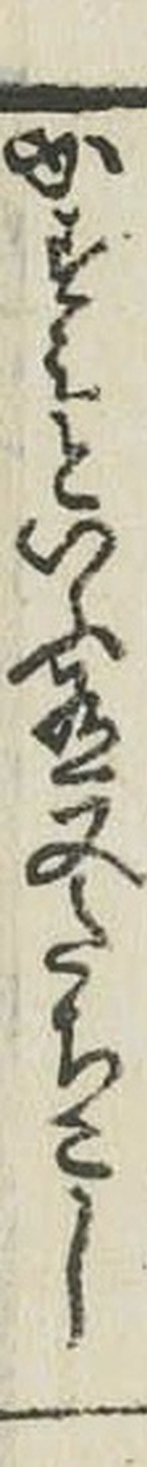かすみといふ有又たちこし
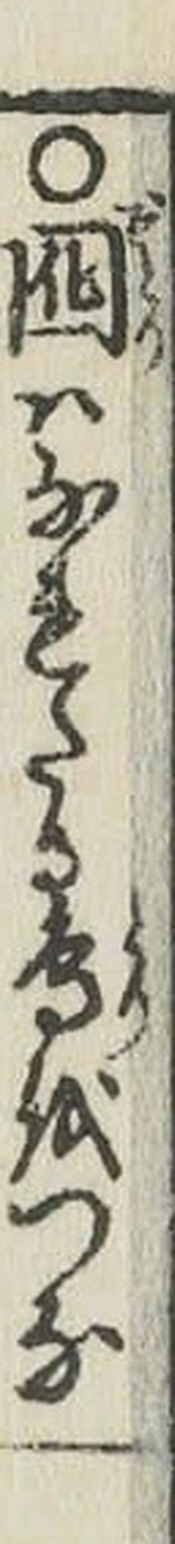○囮はなれたる鳥をつな
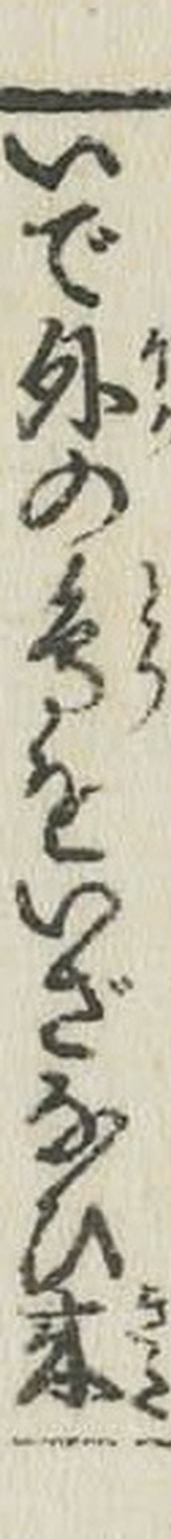いで外の鳥をいざなひ来
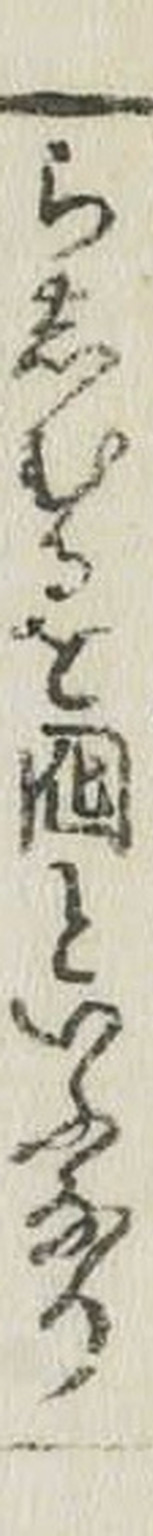らしむるを囮といふなり
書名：増補頭書訓蒙図彙大成 10巻 5:巻之9-11
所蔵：東京学芸大学教育コンテンツアーカイブ
